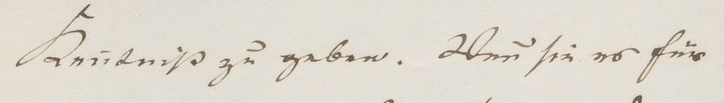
Kenntniß zu geben. Wenn sie es für
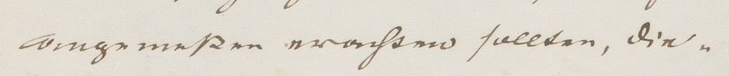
angemeßen erachten sollten, die-
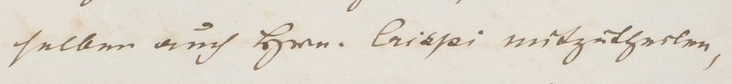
selben auch Hrn. Crispi mitzutheilen,
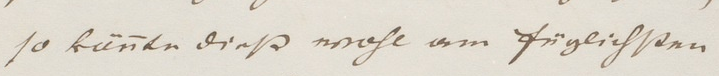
so könnte dieß wohl am füglichsten
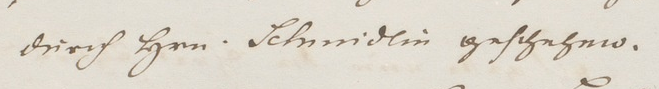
durch Hrn. Schmidlin geschehen.
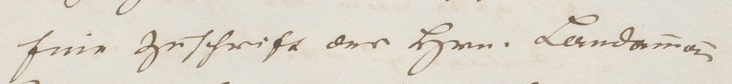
Eine Zuschrift des Hrn. Landammann
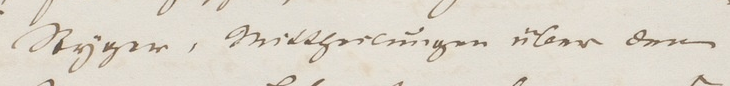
Styger, Mittheilungen über den
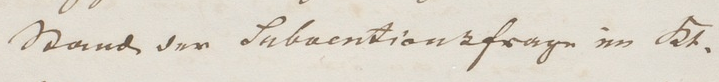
Stand der Subventionsfrage im Kt.
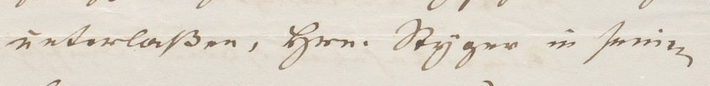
unterlaßen, Hrn. Styger in seinen
